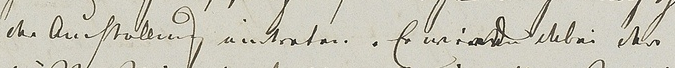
der Ausstellung eintreten. Es wird dabei der
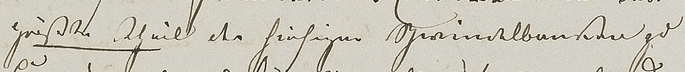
größte Theil der hiesigen Schwindelbanken zu
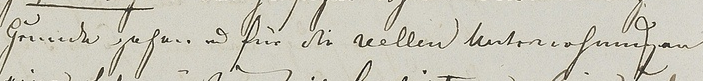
Grunde gehen und für die reellen Unternehmungen
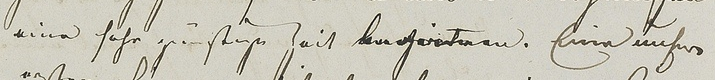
eine sehr günstige Zeit beginnen. Eine unsrer
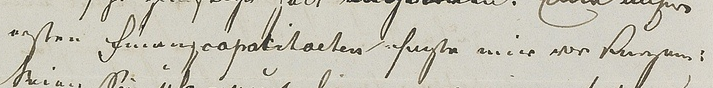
ersten Finanzcapacitaeten sagte mir vor kurzem:
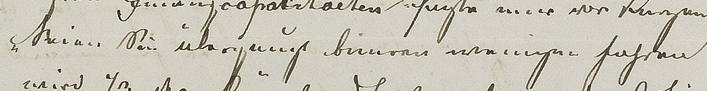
«Seien Sie überzeugt binnen wenigen Jahren
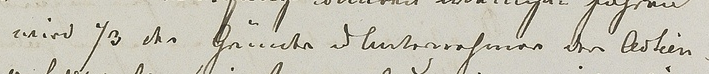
wird ⅓ der Gründer und Unternehmer der Actien
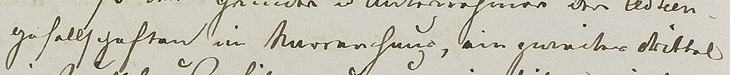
gesellschaften im Narrenhaus, ein zweites Drittel
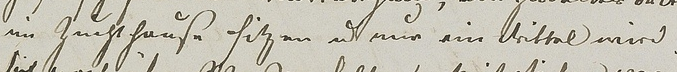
im Zuchthause sitzen und nur ein Drittel wird
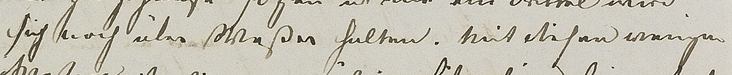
sich noch über Waßer halten.» Mit diesen wenigen
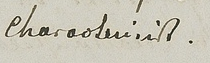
characterisirt.
